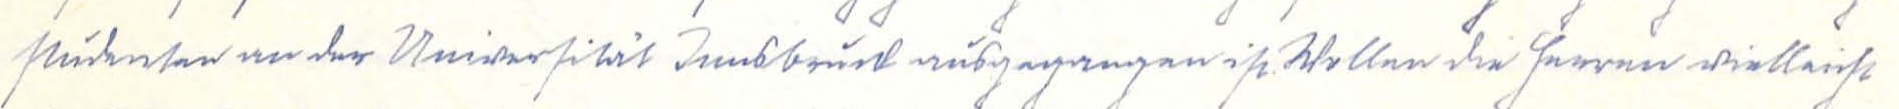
studenten an der Universität Innsbruck ausgegangen ist. Wollen die Herren vielleicht
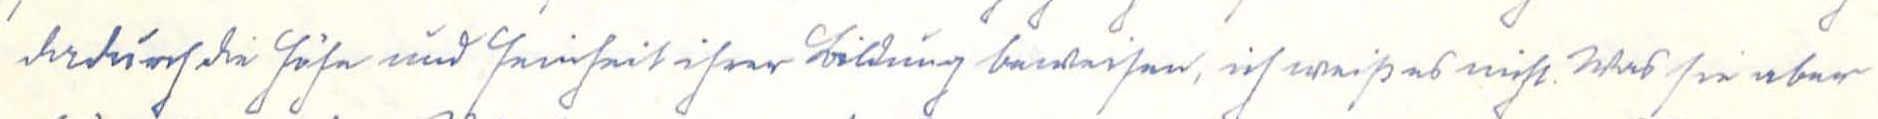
dadurch die Höhe und Feinheit ihrer Bildung beweisen, ich weiß es nicht. Was sie aber
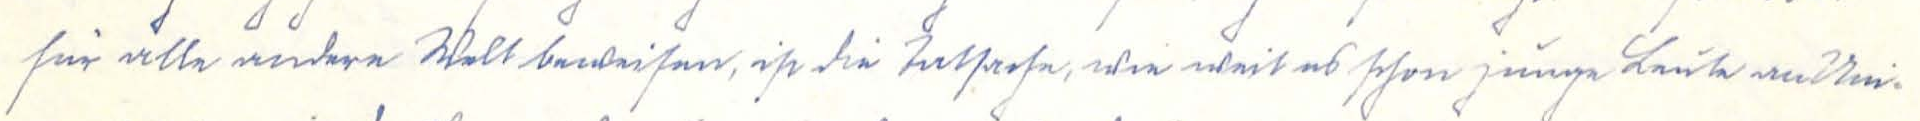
für alle andere Welt beweisen, ist die Tatsache, wie weit es schon junge Leute an Uni-
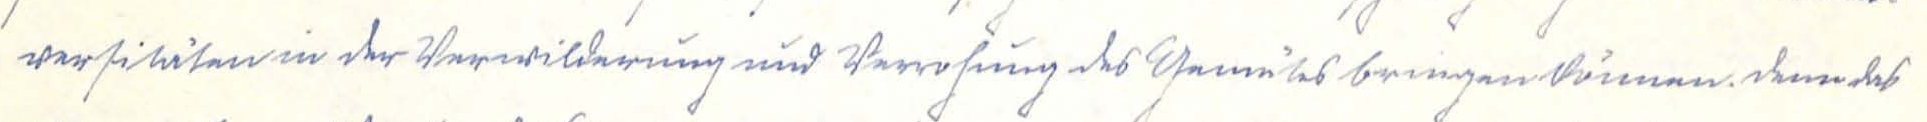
versitäten in der Verwilderung und Verrohung des Gemütes bringen können. Denn das
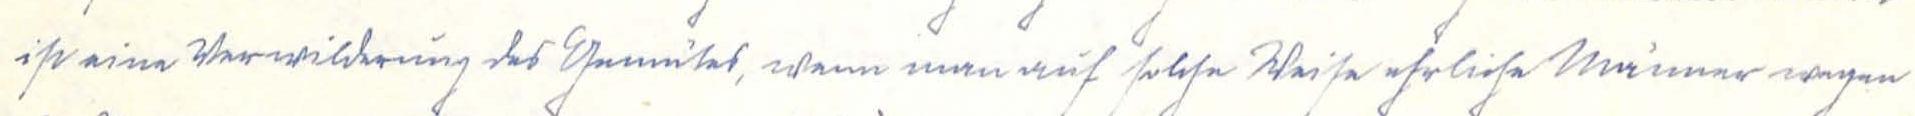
ist eine Verwilderung des Gemütes, wenn man auf solche Weise ehrliche Männer wegen
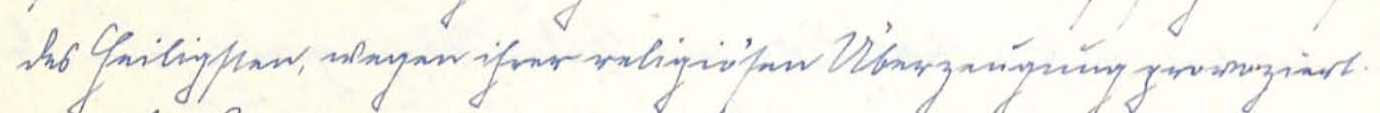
des Heiligsten, wegen ihrer religiösen Überzeugung provoziert.
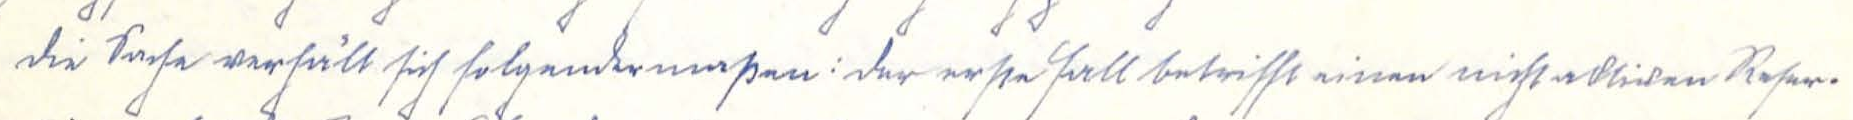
Die Sache verhält sich folgendermaßen: Der erste Fall betrifft einen nicht aktiven Reser-
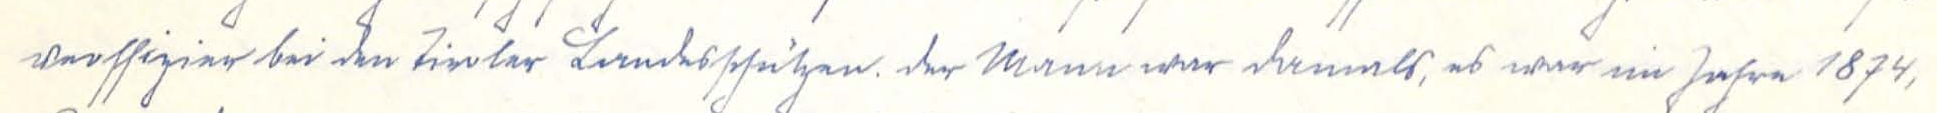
veoffizier bei den Tiroler Landesschützen. Der Mann war damals, es war im Jahre 1874,
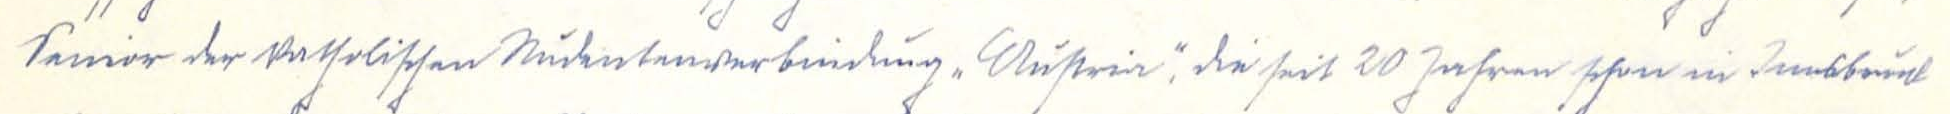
Senior der katholischen Studentenverbindung "Austria"-Innsbruck, die seit 20 Jahren schon in Innsbruck
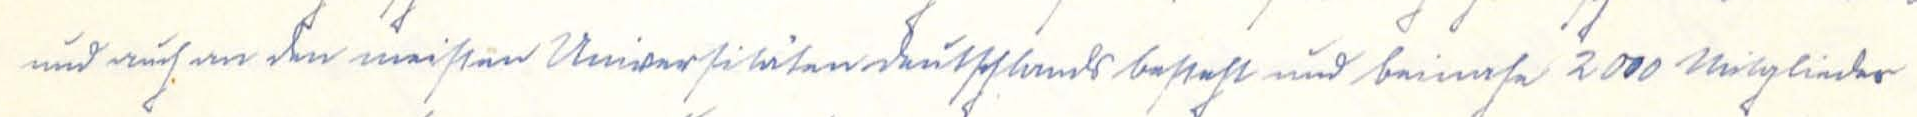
und auch an den meisten Universitäten Deutschlands besteht und beinahe 2000 Mitglieder
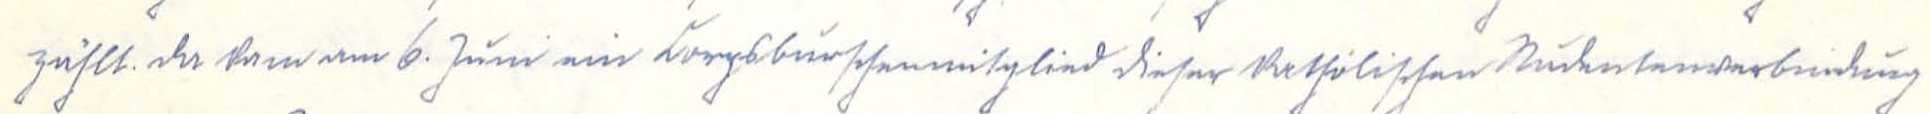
zählt da kam am 6. Juni ein Corpsburschenmitglied dieser katholischen Studentenverbindung
